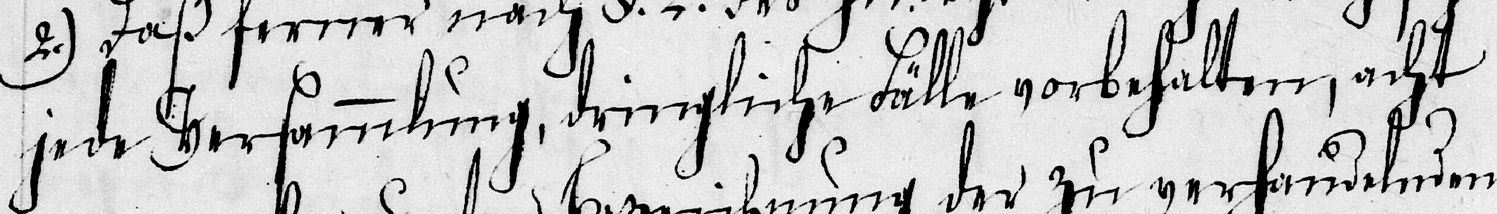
jede Versammlung, dringliche Fälle vorbehalten, acht
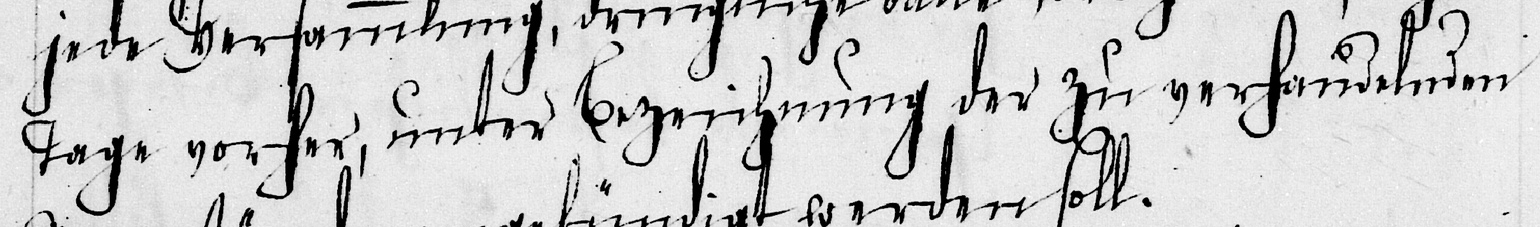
Tage vorher, unter Bezeichnung der zu verhandelnden
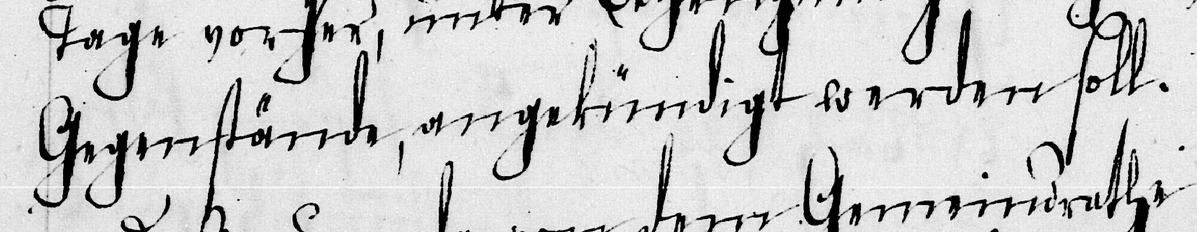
Gegenstände, angekündigt werden soll.
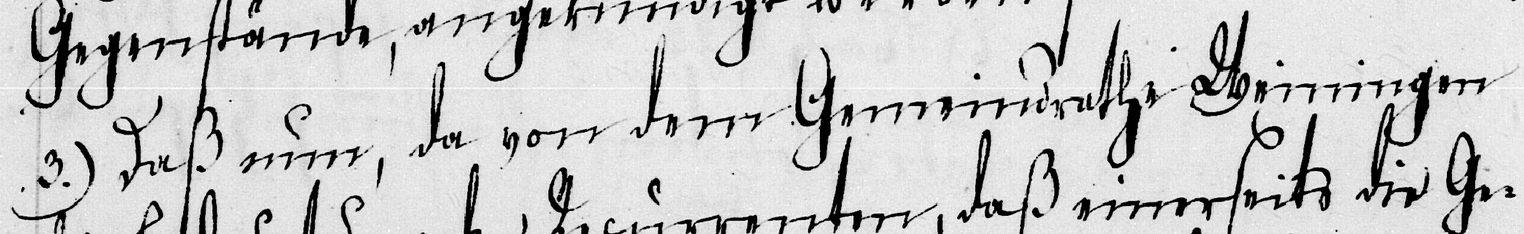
3.) Daß nun, da von dem Gemeindrathe Weiningen
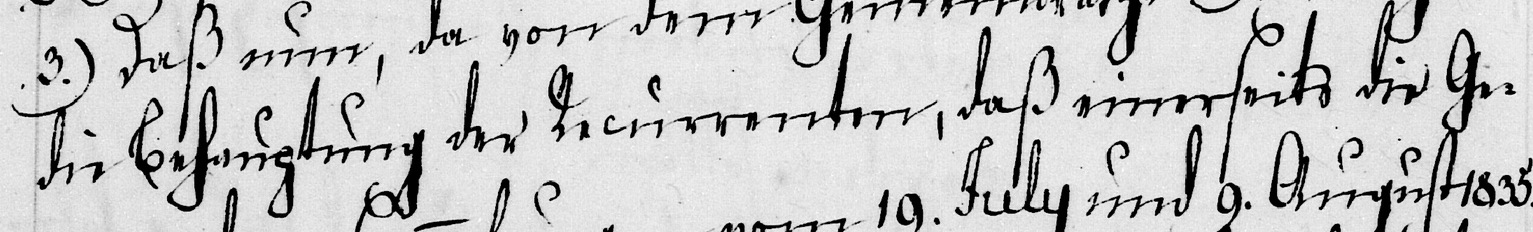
die Behauptung der Recurrenten, daß einerseits die Ge¬
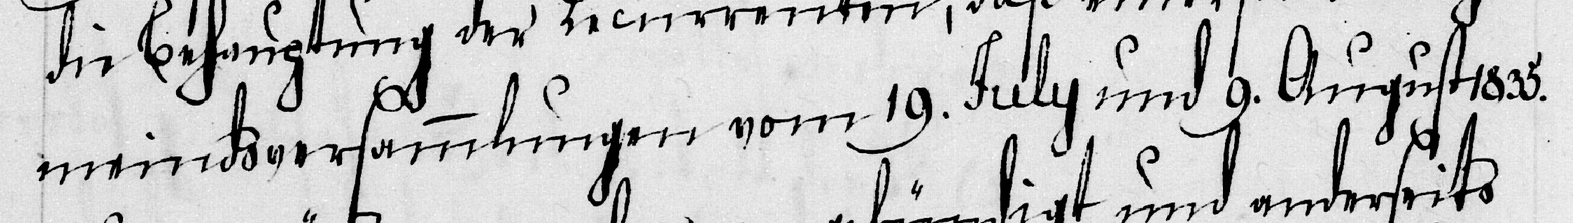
meindsversammlungen vom 19. July und 9. August 1835.
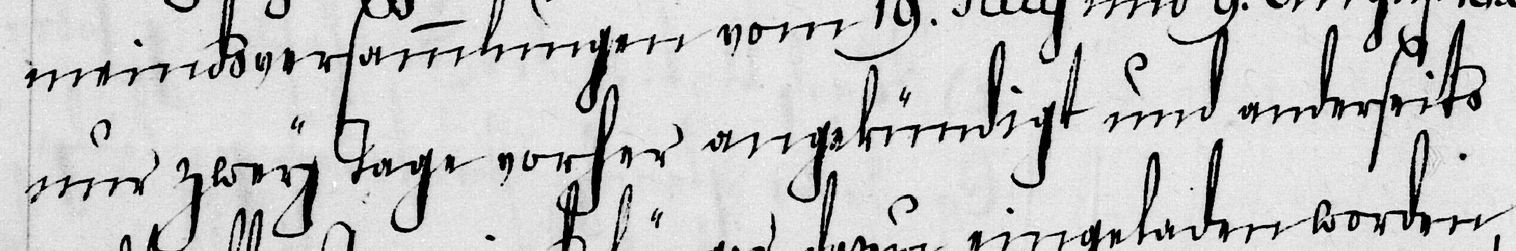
nur zwey Tage vorher angekündigt und anderseits
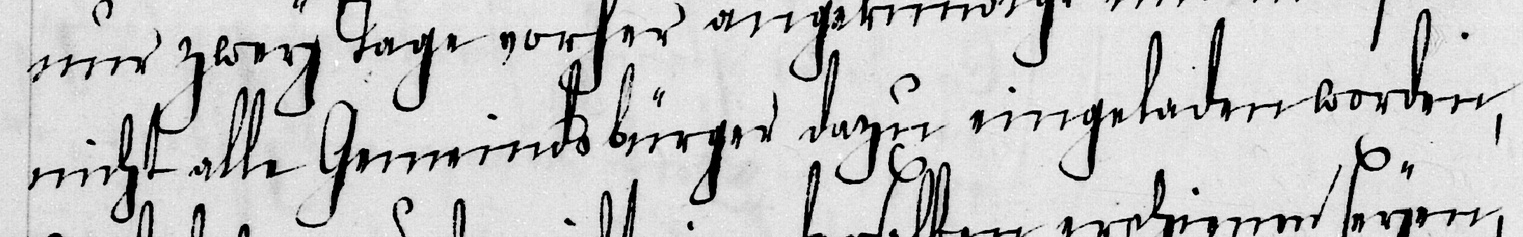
nicht alle Gemeindsbürger dazu eingeladen worden,
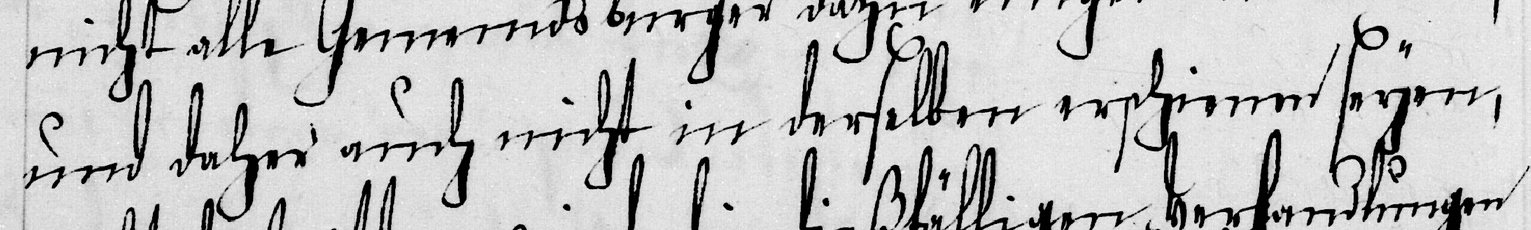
und daher auch nicht in derselben erschienen seyen,
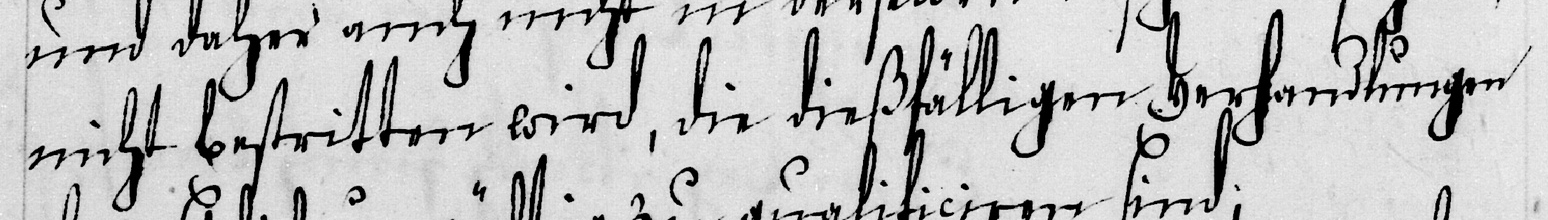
nicht bestritten wird, die dießfälligen Verhandlungen
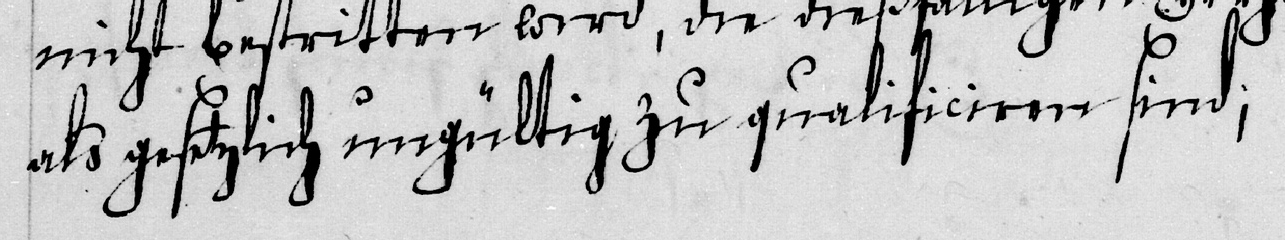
als gesetzlich ungültig zu qualificiren sind;
